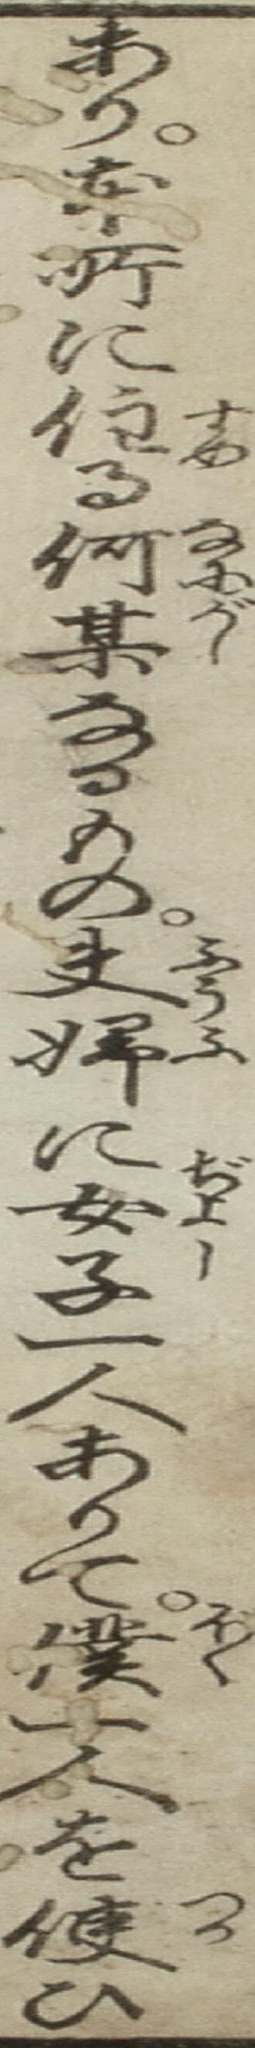あり。本所に住る何某なるもの。夫婦に女子一人ありて。僕一人を使ひ
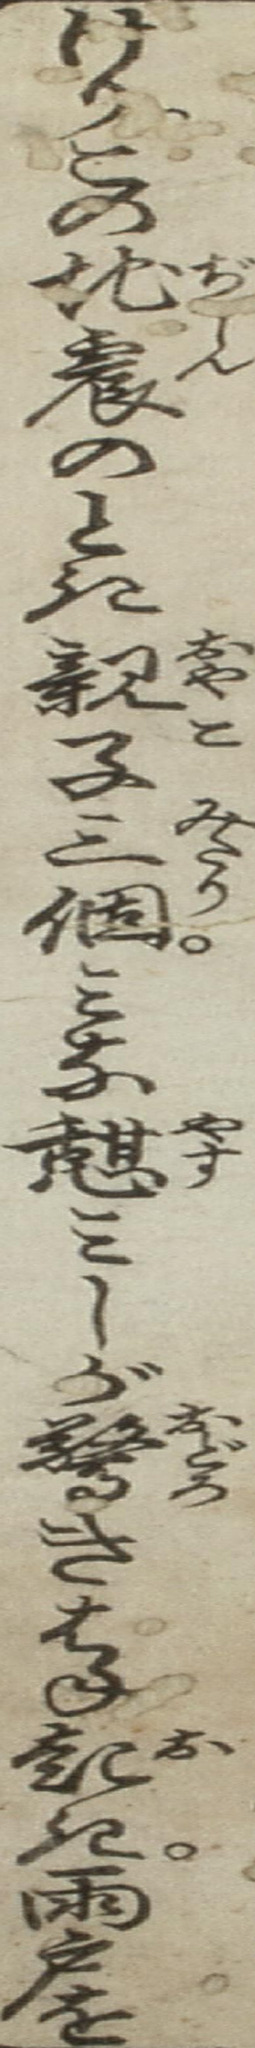けり。この地震のとき親子三個。みな憩みしが驚きはね起き。雨戸を
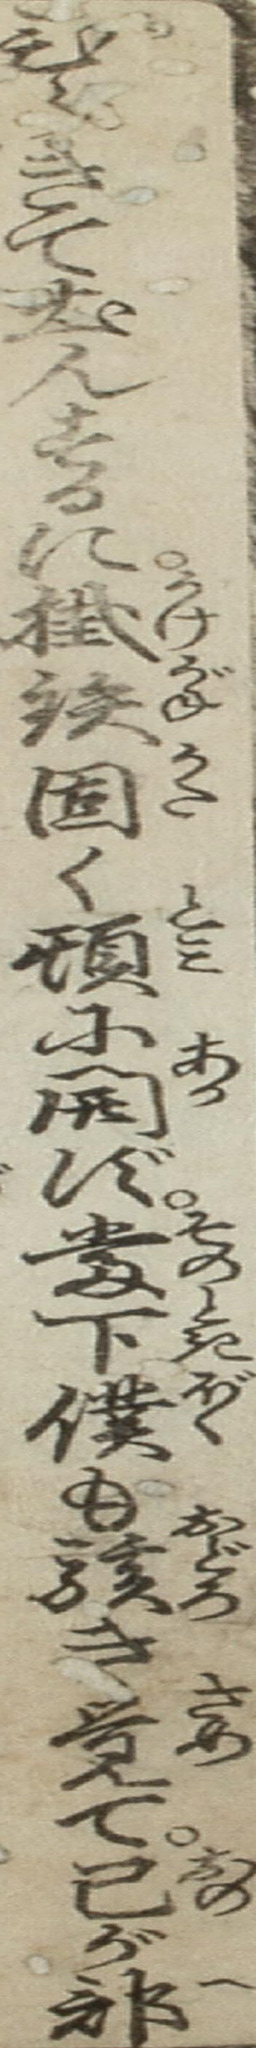ひらきて出んするに。掛鉄固く頓に開ず。当下僕も駭き覚て。己が部
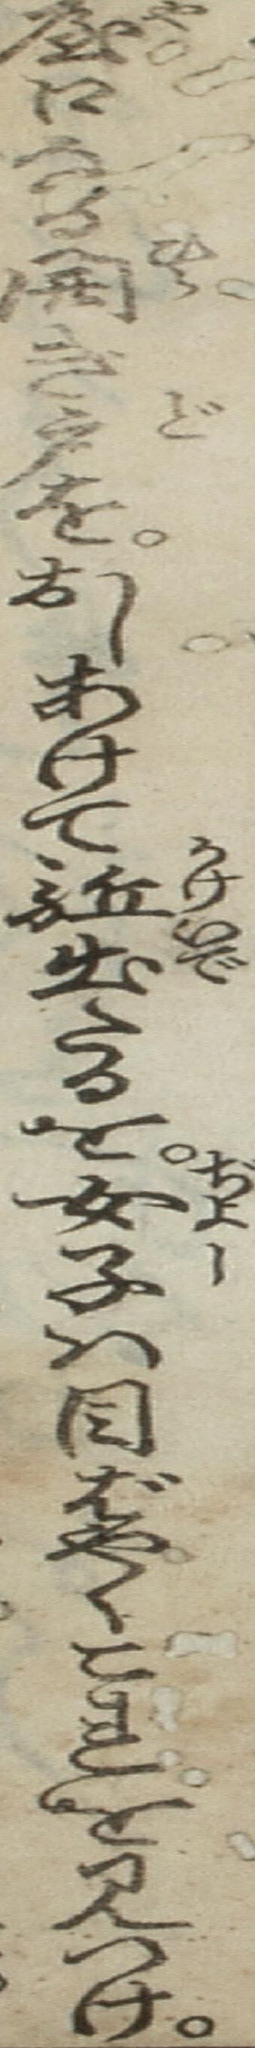屋口なる開き戸を。おしあけて駈出たるを。女子は目ばやくこれを見つけ。
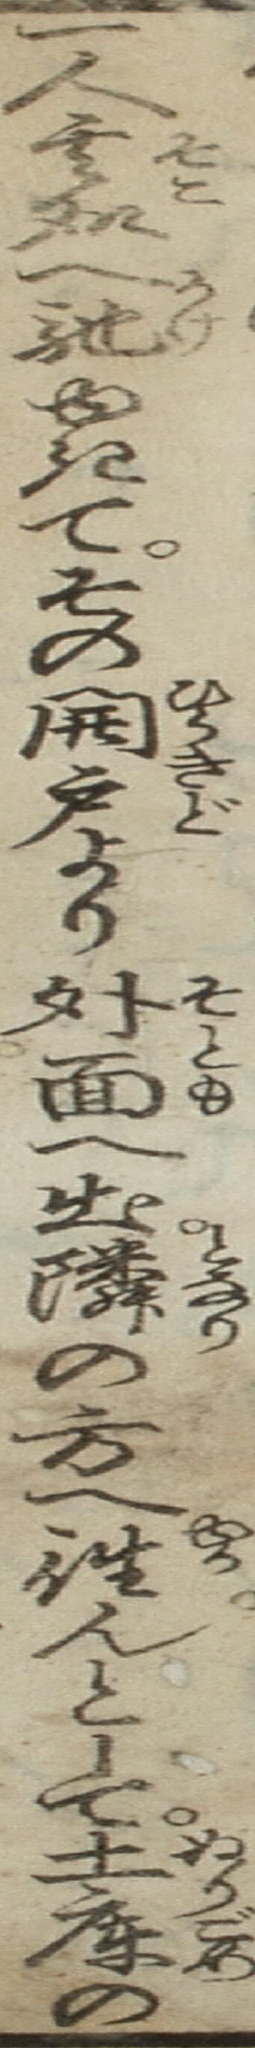一人其処へ馳ゆきて。その開戸より外面へ出。隣の方へ往んとして。土庫の
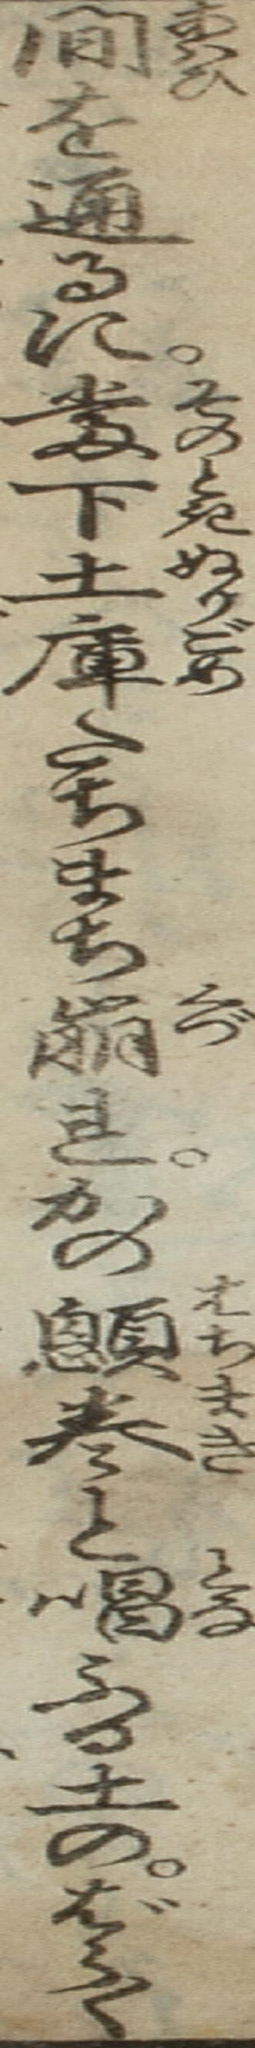間を通るに。当下土庫たちまち崩れ。かの鉢巻と唱ふる土の。ばら〳〵
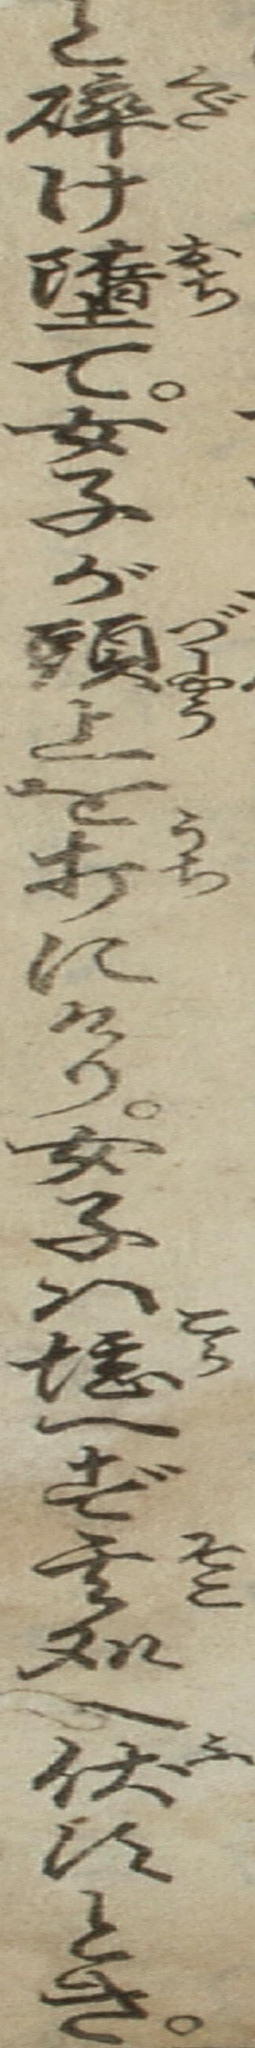と砕け堕て。女子が頭上を打にけり。女子は堪へず其処へ伏すとき。
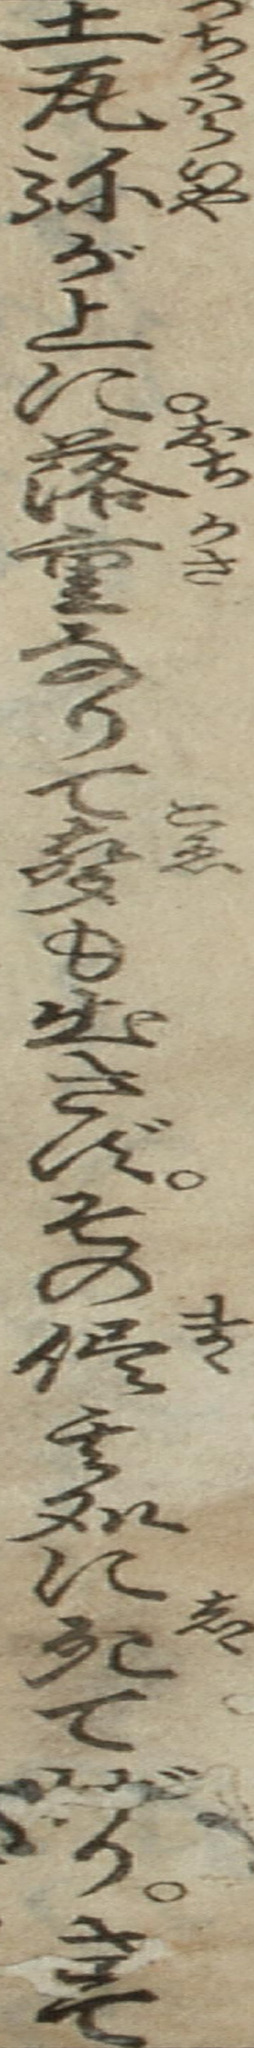土瓦弥が上に。落重なりて声も出さず。その侭其処に死てげり。さて
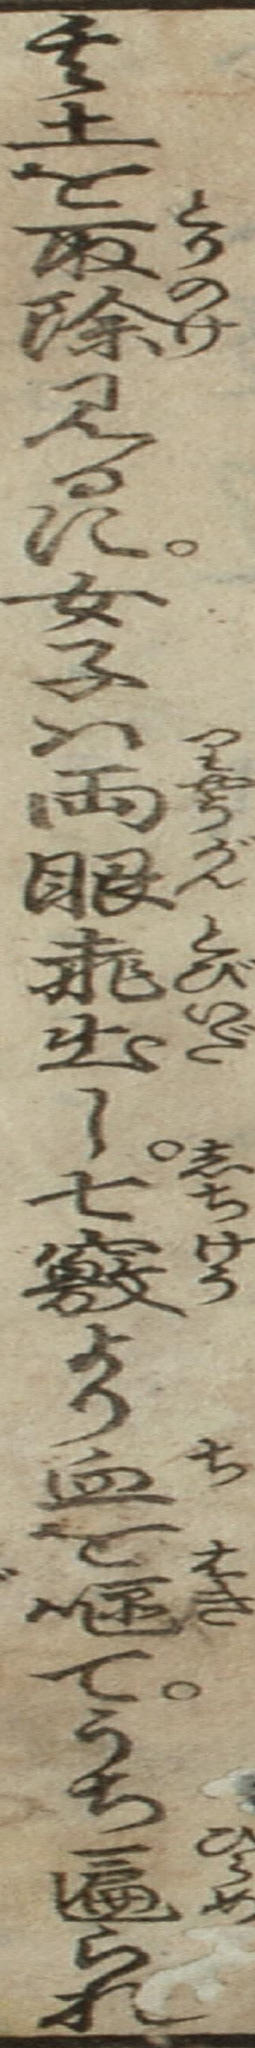其土を取除見るに。女子は両眼飛出し。七竅より血を嘔て。うち匾られ
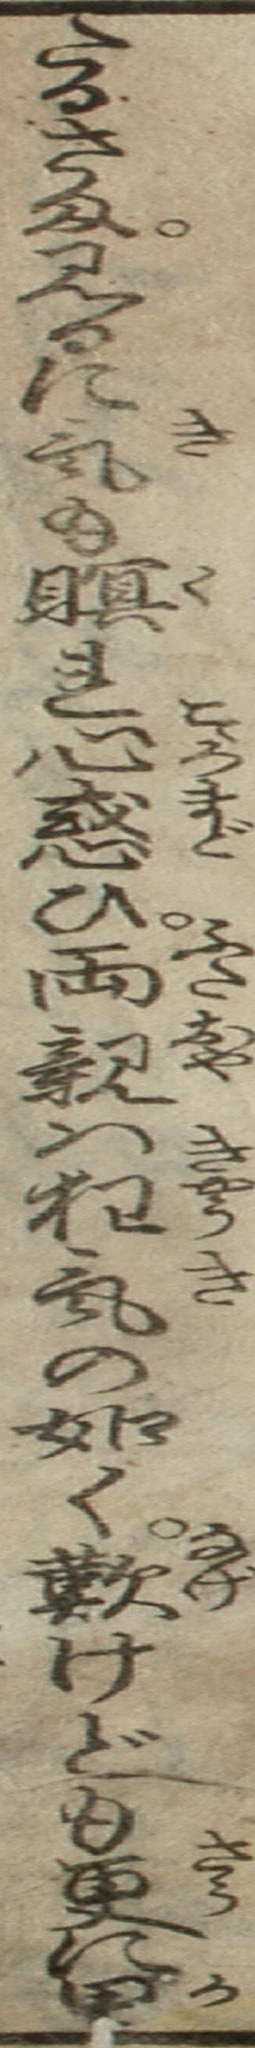たるさま。見るに気も瞑れ心惑ひ。両親は狂気の如く。歎けども更に甲
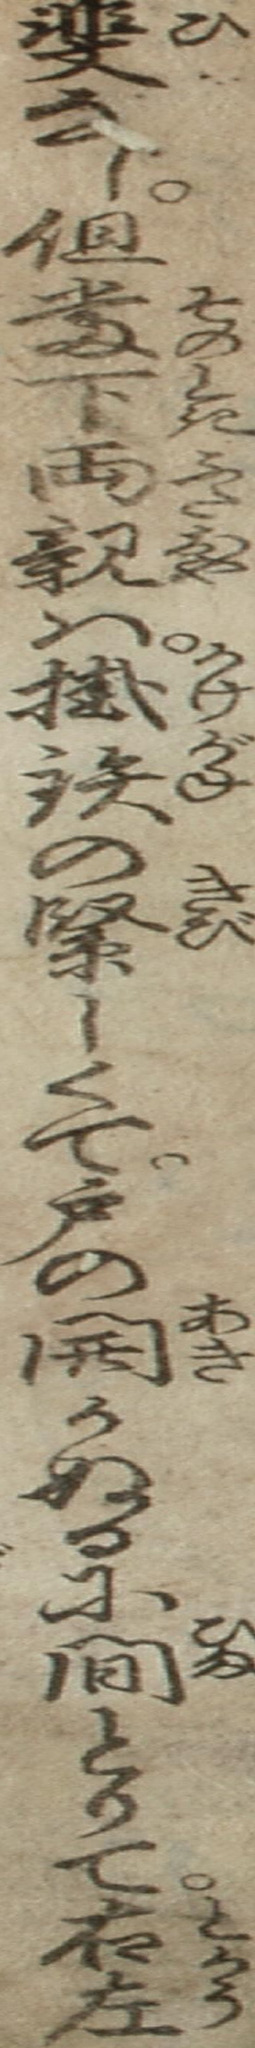斐なし。但当下両親は。掛鉄の緊しくて。戸の開かぬるに間とりて。右左
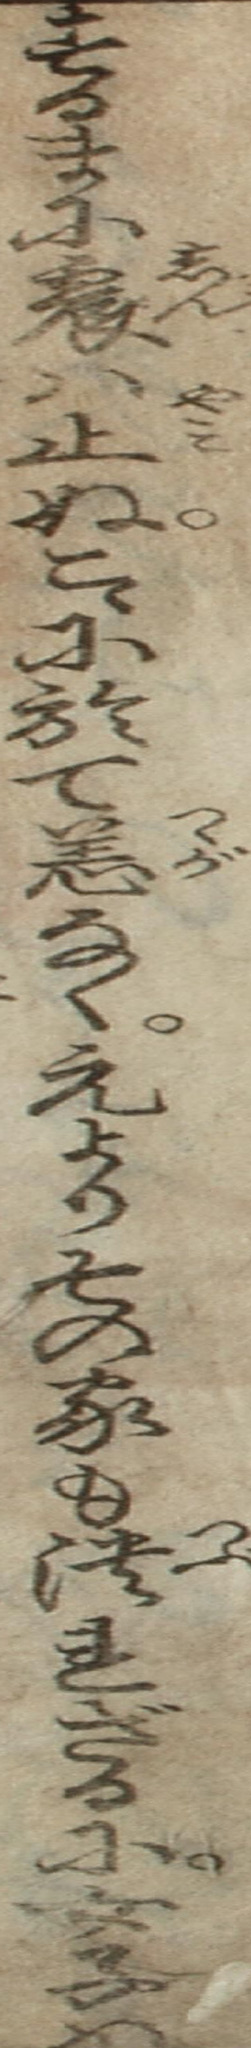するまに震は止ぬ。こゝに於て恙なく。元よりその家も潰れざるに。女子は
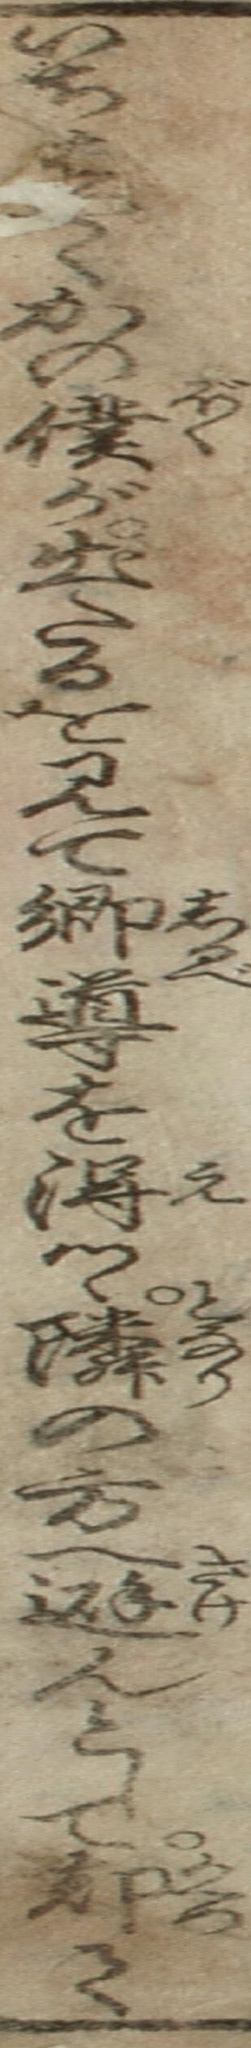いちはやくかの僕が。出たるを見て郷導を得つゝ。隣の方へ避んとして。却て

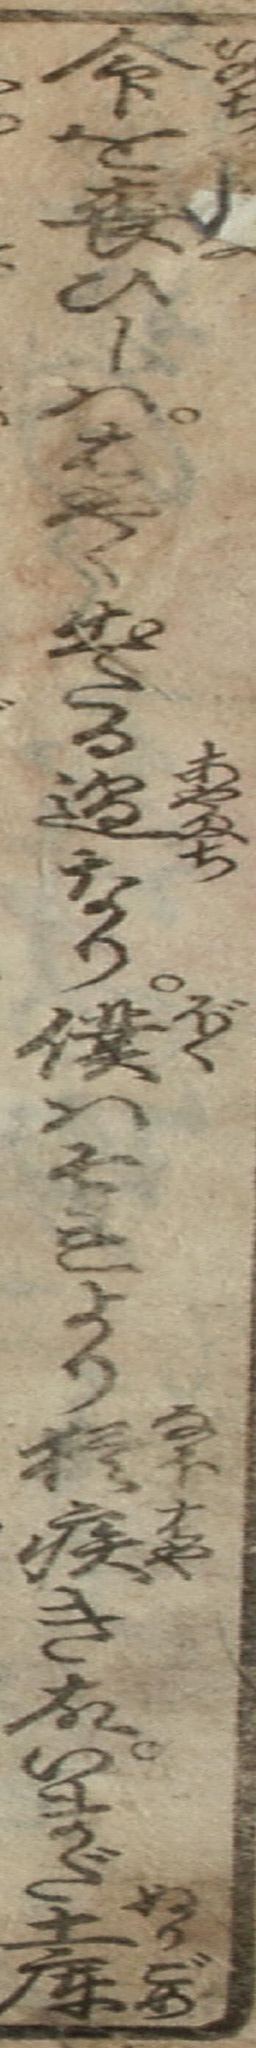命を喪ひしは。はやく出たる過なり。僕はそれより猶疾き故。いまだ土庫
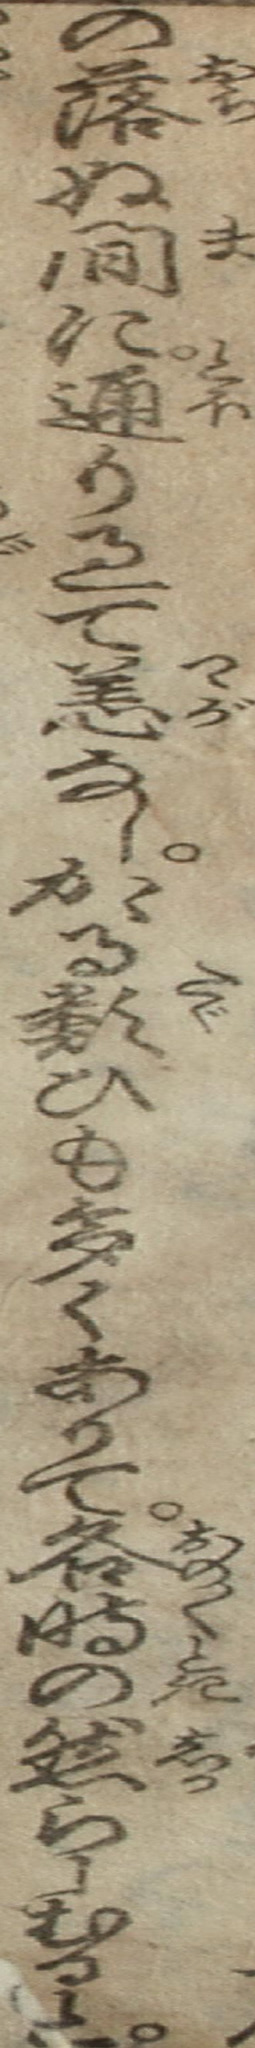の落ぬ間に。通りゑて恙なし。かゝる類ひも多くありて。各時の然らしむると。
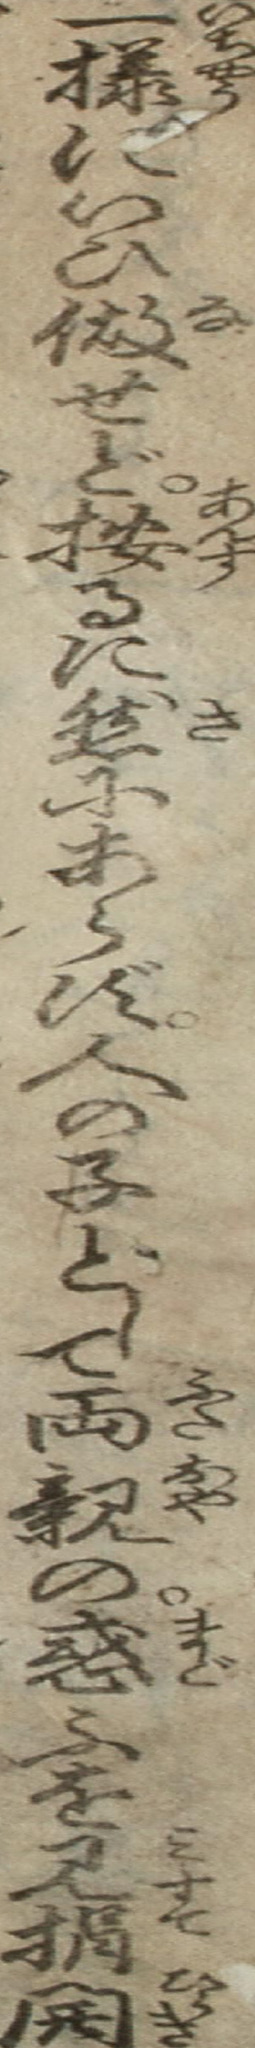一様にいひ倣せど。按ずるに然にあらず。人の子として両親の。惑ふを見捐開
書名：安政見聞録　中
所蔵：東京大学地震研究所図書室 Earthquake Research Institute Library, The University of Tokyo, JAPAN
